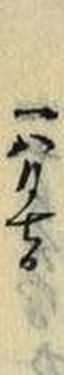一八月五日
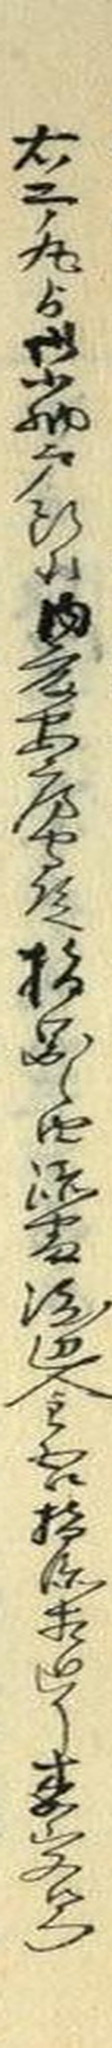右二ノ丸ゟ御小納戸頭取内藤安房守殿指図之由添番渡辺金吾指添相廻り森山又左衛門
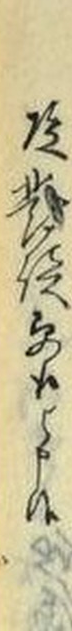殿対談受取被申候
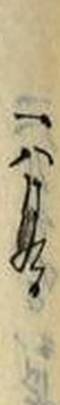一八月五日
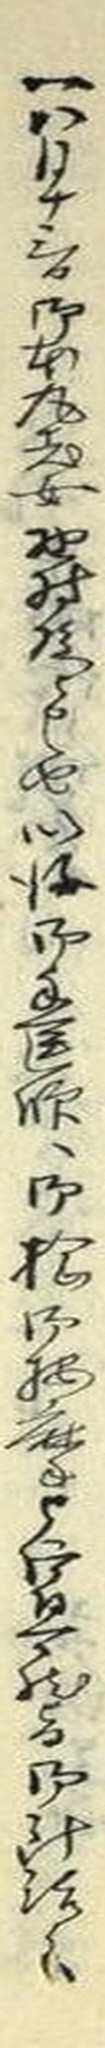一八月十三日御本丸老女野村殿被申候由以後御手医師へ御捻御按摩被仰付可然旨御針治之
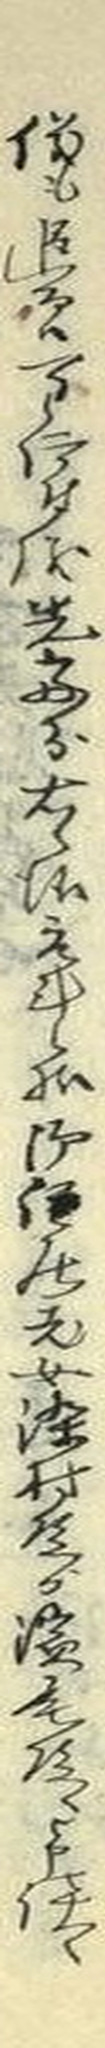儀も追而ハ可被仰付儀先当分右之趣取計候様御住居老女染村殿ゟ浜尾殿へ被申談候
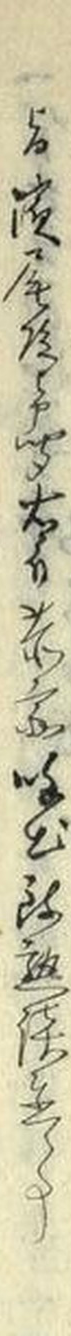旨浜尾殿被申聞右ニ付恭斎呼出致熟談置候事
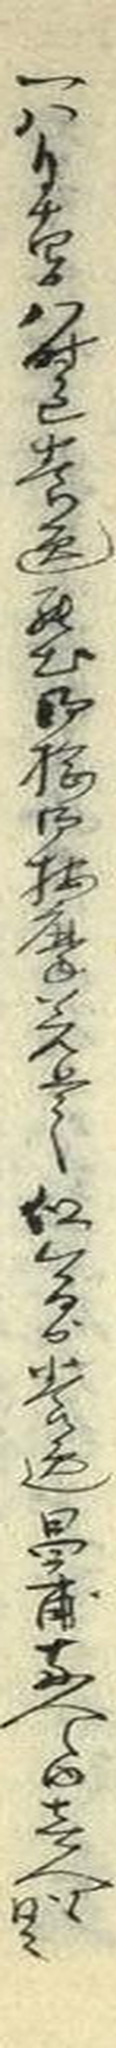一八月十四日八時過養逸罷出御捻御按摩差上之但今日ゟ養逸易甫両人之内壱人ツヽ日々
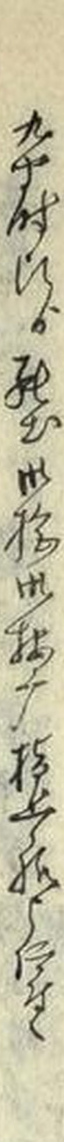九半時頃ゟ罷出御捻御按摩指上候様被仰付候
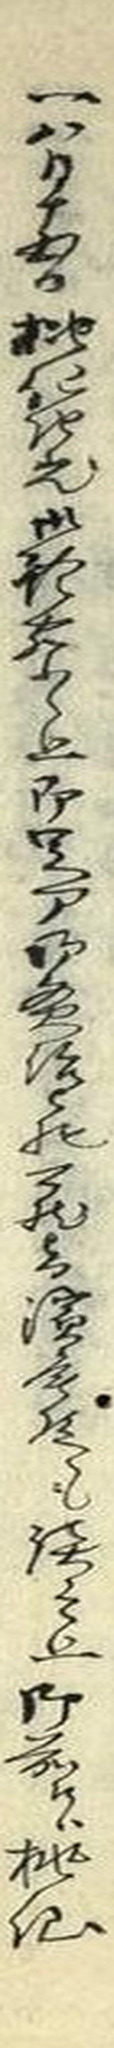一八月十五日桃仙院老御診察之上御足部御灸治被遊可然旨浜尾殿へも談之上御前江ハ桃仙
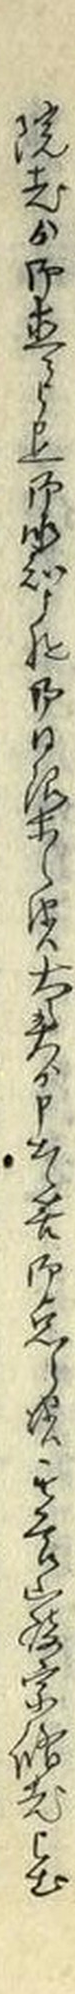院老ゟ御直ニ被申上御承知被遊御日限等之儀ハ大奥ゟ申出候筈御点之儀ハ其節山崎宗脩老被出
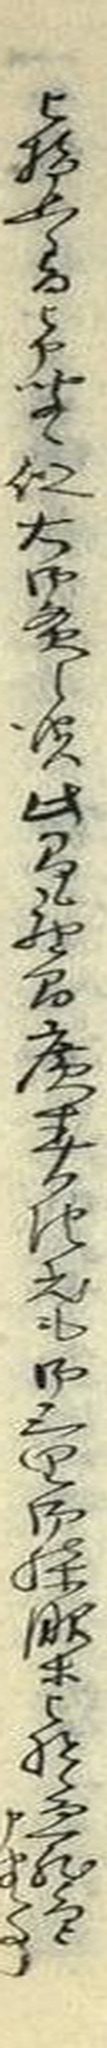被指上候旨被申聞候但右御灸之儀ハ此間も野間広春院老も御三里御膝眼等被遊候而可然旨被申聞候事

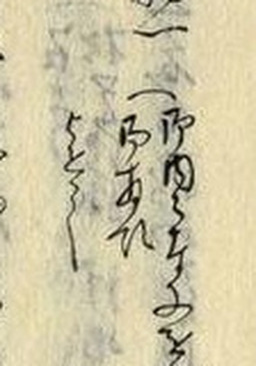御拝領
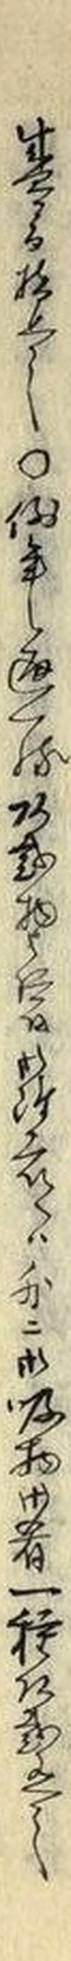盛ニ而指上之〇例年之通一縁頂戴物被仰付御附衆へハ外ニ御吸物御肴一種頂戴有之
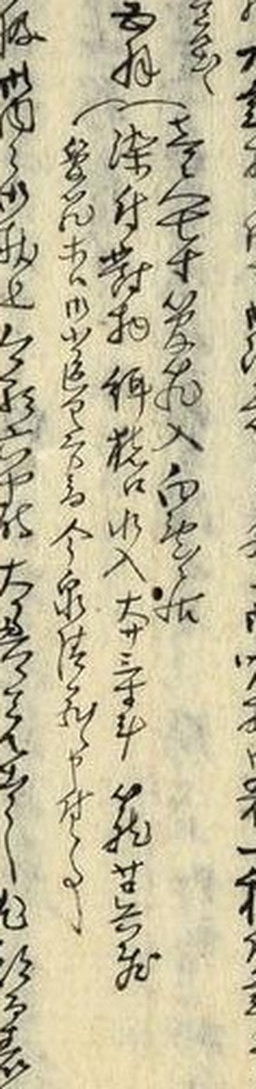染付対物餌猪口水入大サ三寸斗籠茣敷
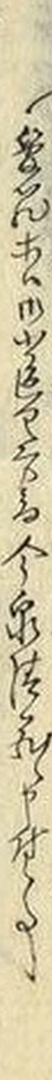管籠等ハ御小道具方ニ而今泉清蔵へ申付候事
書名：少傅日録抄（斉善付側向頭取日記、在府）
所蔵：福井県文書館 Fukui Prefectural Archives
